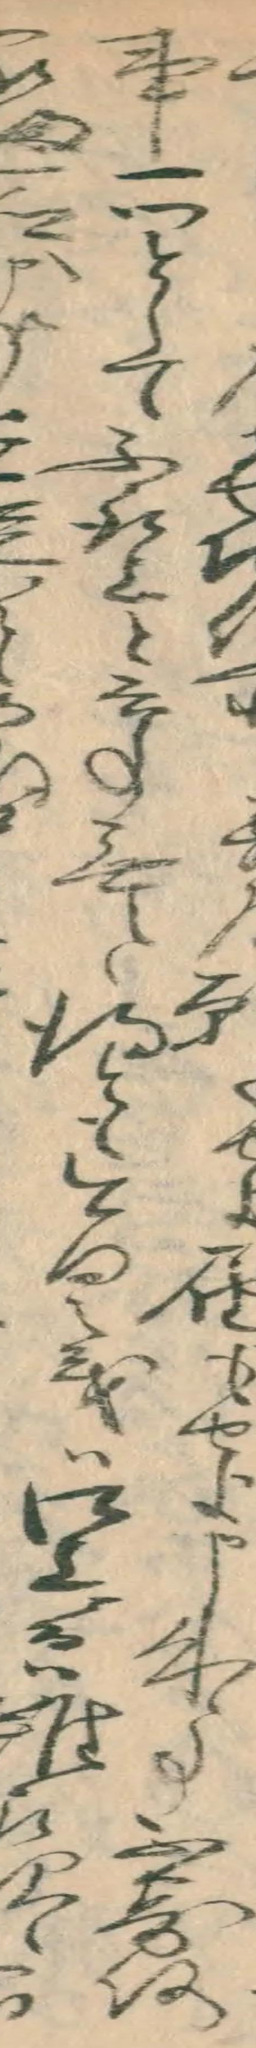事一ツとして不取上と云事無之候得とも今日之義ハ口上ニ而ハ難取次候間
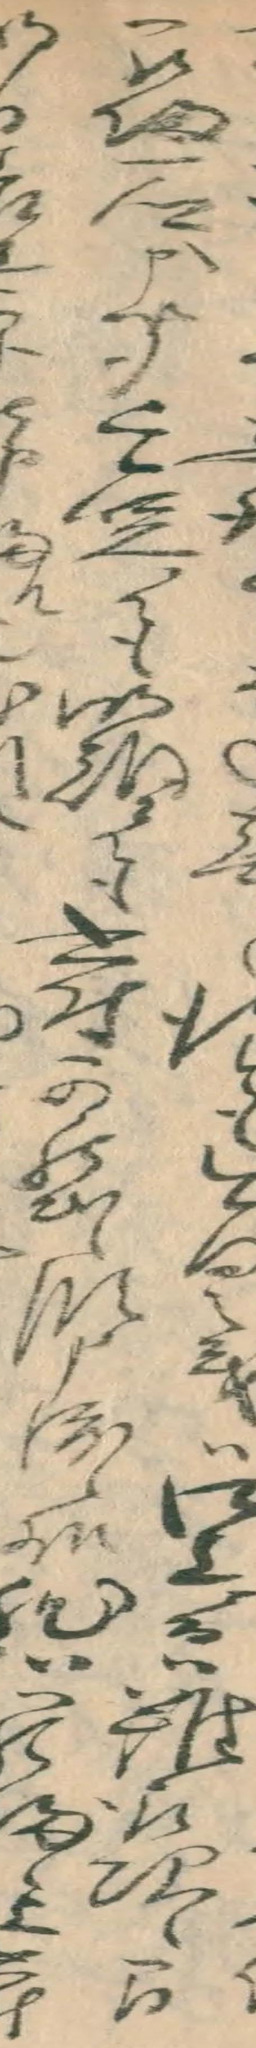罷帰一郷へ申聞今晩ニても明朝ニても書付可指出候段申渡候処然ハ罷帰候上書付
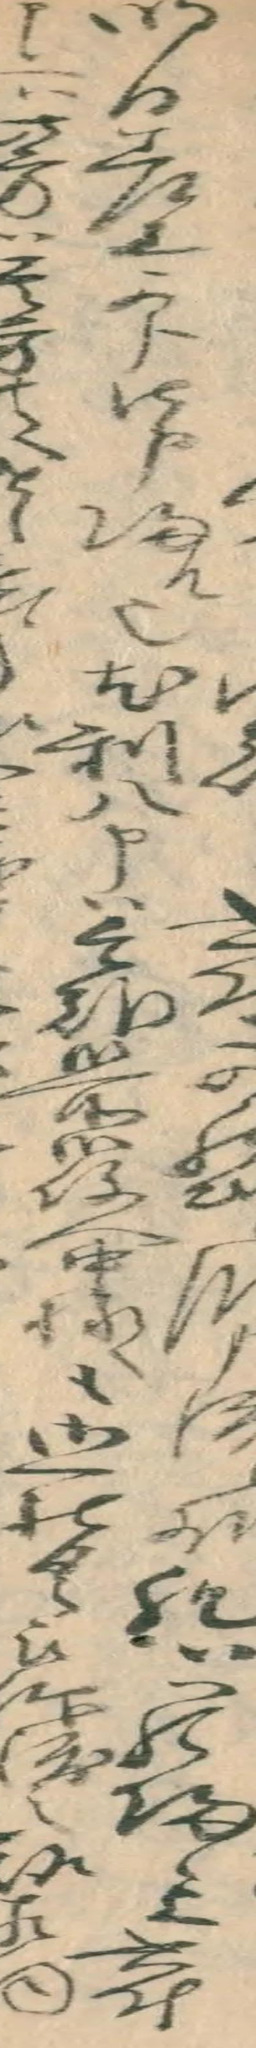明日差上可申由申帰ル也尤利八申ハ今朝御所御役人中様へも御一社ゟ被仰渡之趣相伺
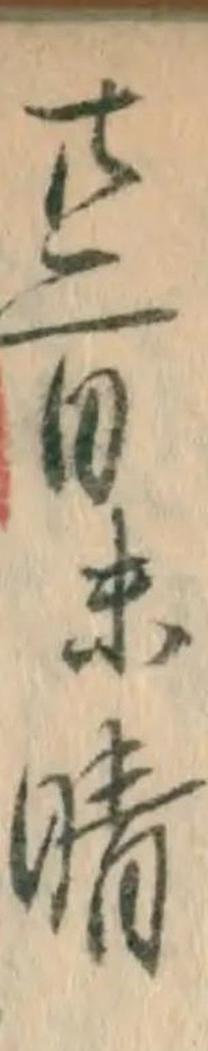廿二日未晴
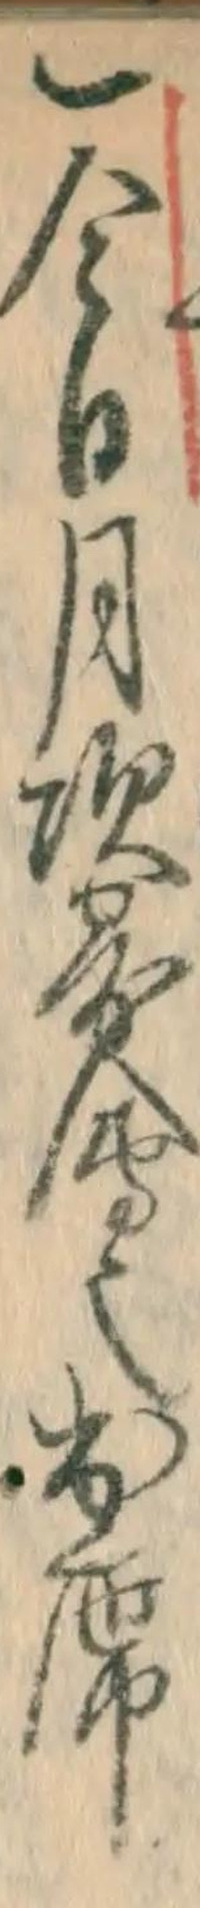一今日月次寄会也出席
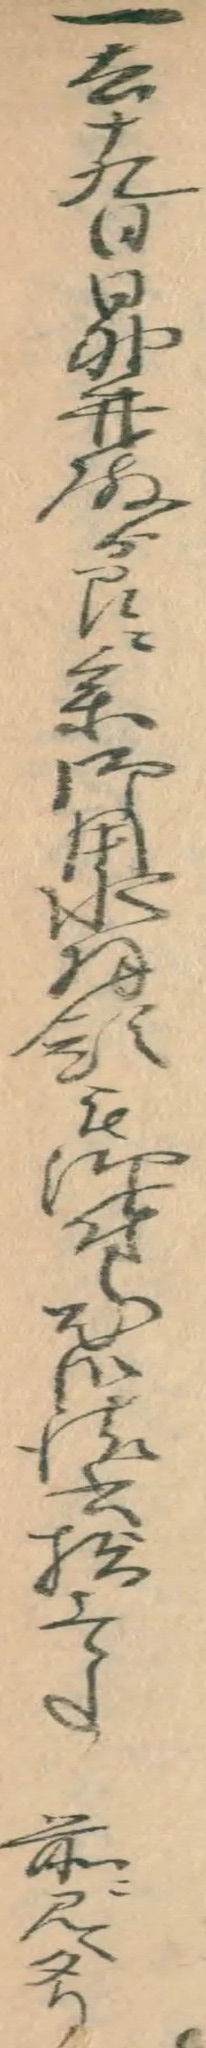一去十九日日野弁殿ゟ召ニ参御用水拝領被仰付候尤御請書指上候事前ニ見へタり

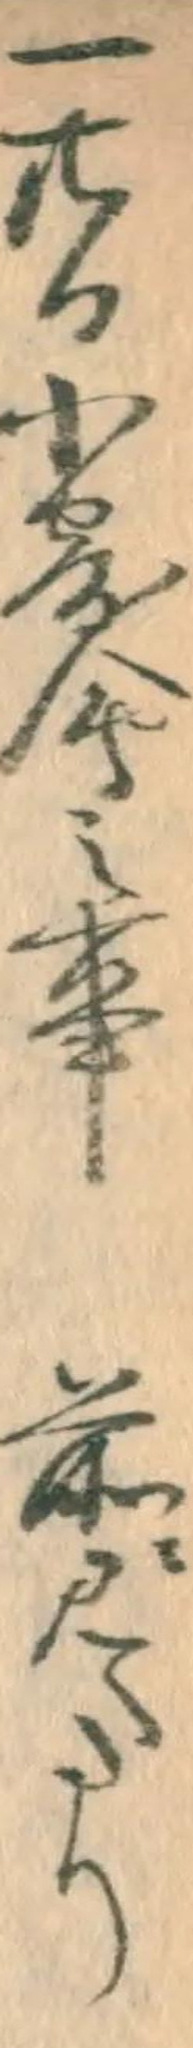一廿日小寄会之事前ニ見へたり
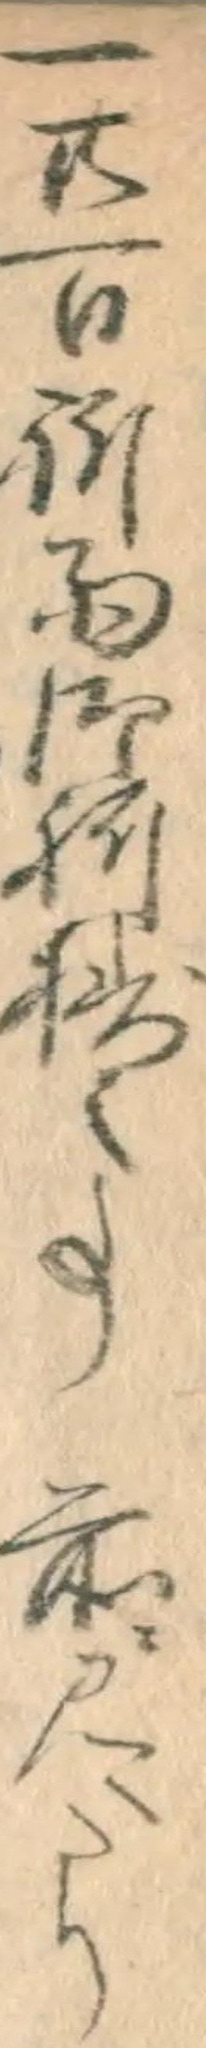一廿一日祈雨御祈祷之事前ニ見へたり
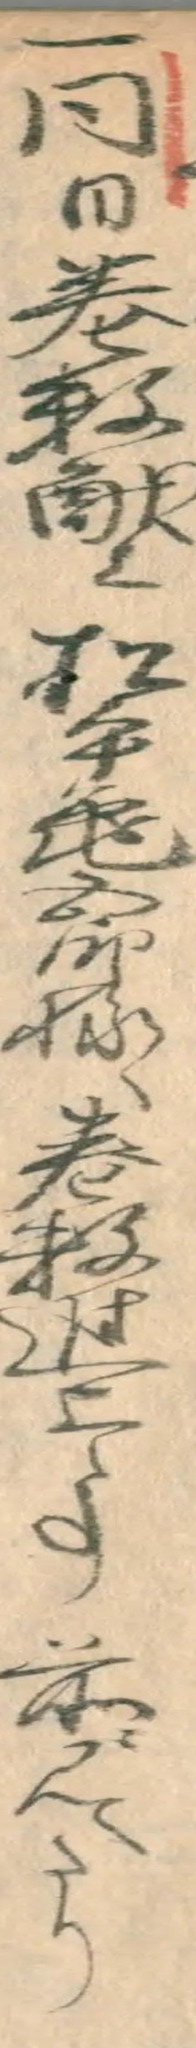一同日巻数献上松平亀五郎様へ巻数進上之事前ニ見へたり
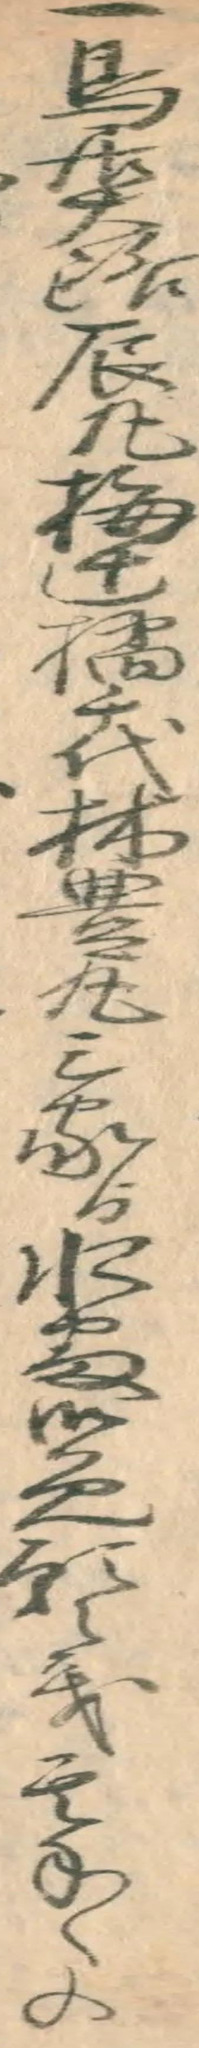一鳥居大路辰丸梅辻橘千代林豊丸三家ゟ水番御免願之義其手への
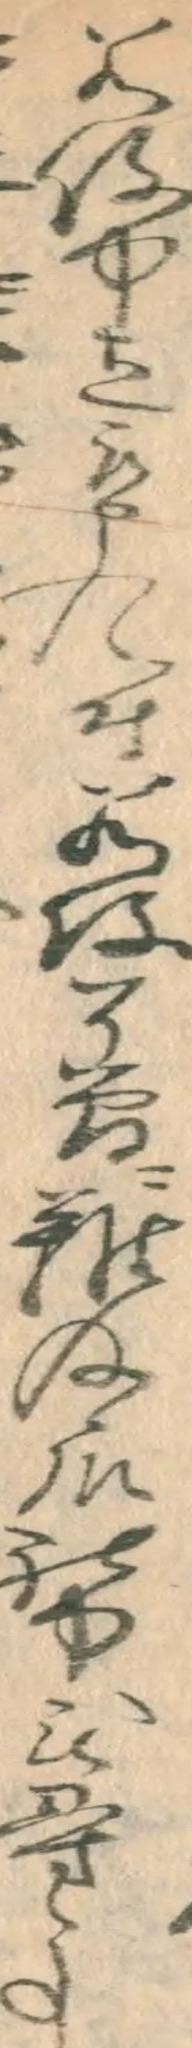若役中迄被申入候ニ付若役了簡ニ難及候故社中へ被尋候事
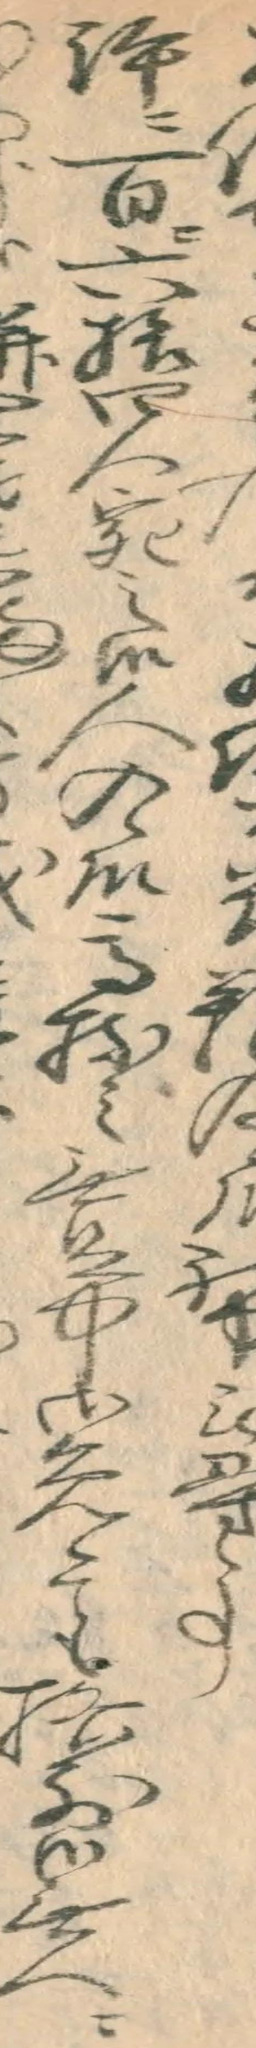評ニ一日ニ六拾四人宛之御人入候故高持之無足中御免候ても格別御無人ニ
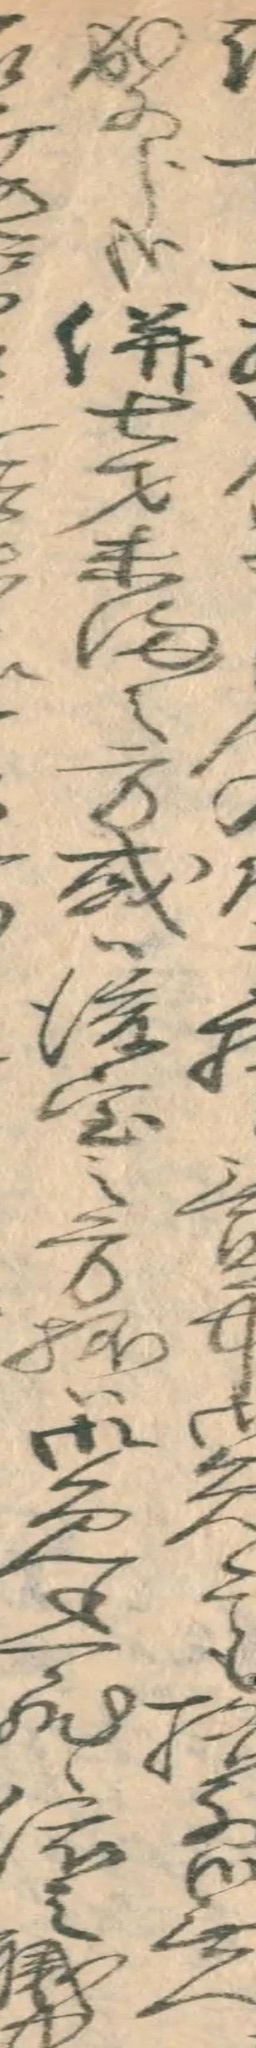成可申哉併七才未満之方或ハ後室之方抔ハ御免も可然候依之職中
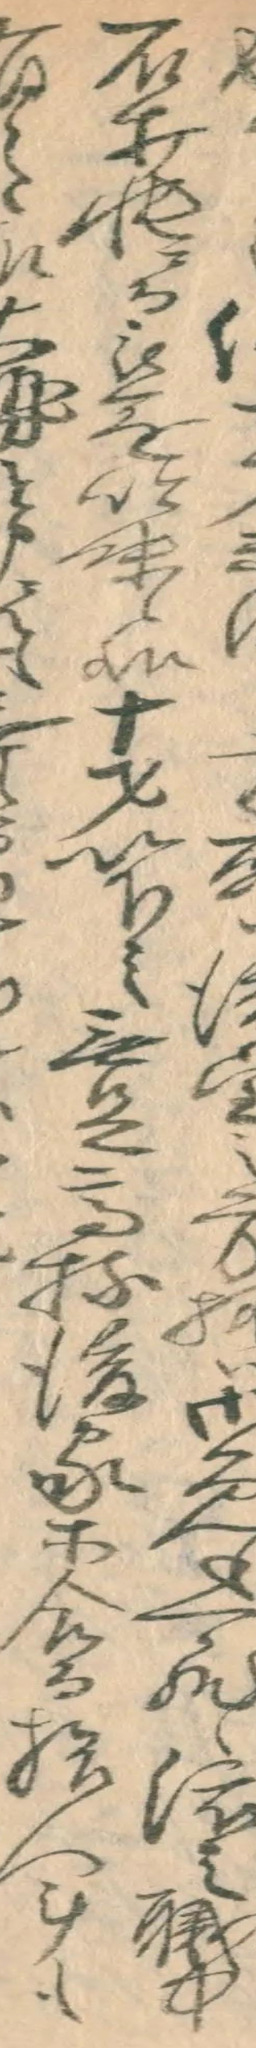石打帳ニ而被懸吟味候処十才以下之無足高持後家等合而拾人計も
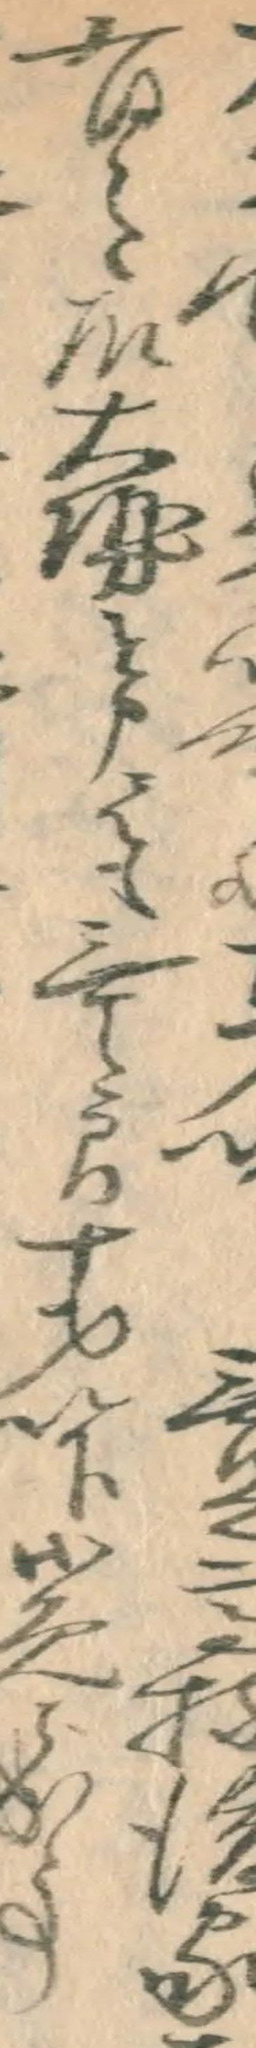有之候故大勢と申ニても無之候間十才以下御免被成候事
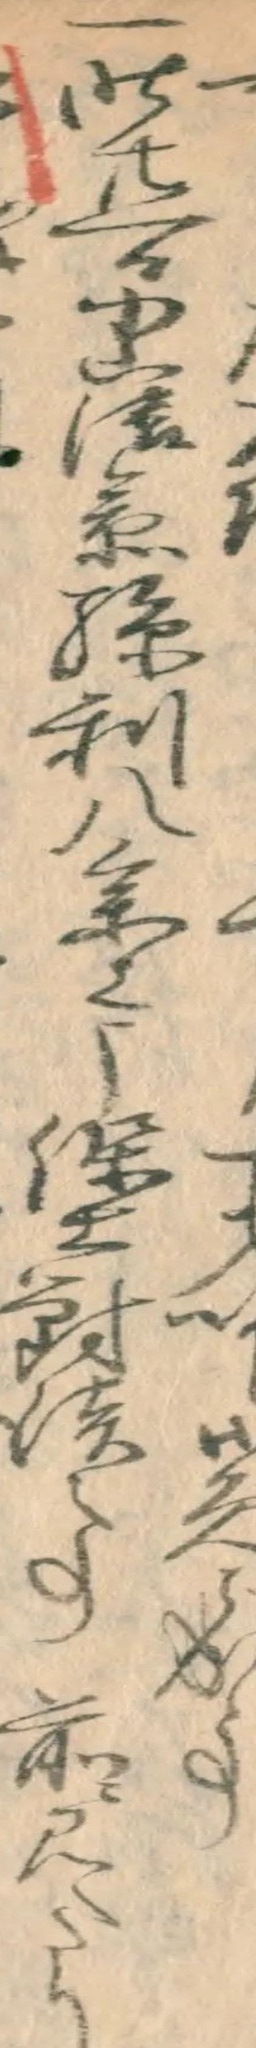一昨廿一日小山清兵衛孫利八参上申保土対談之事前ニ見へたり
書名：賀茂社記録. 第58冊
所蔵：国立国会図書館 National Diet Library, JAPAN
